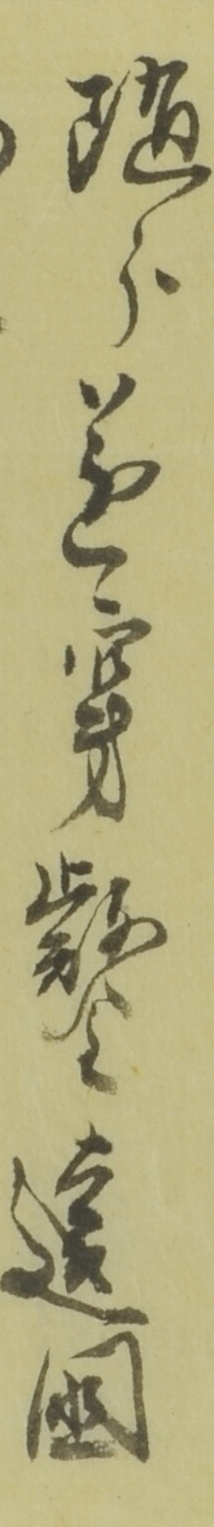随分遂穿鑿遠国
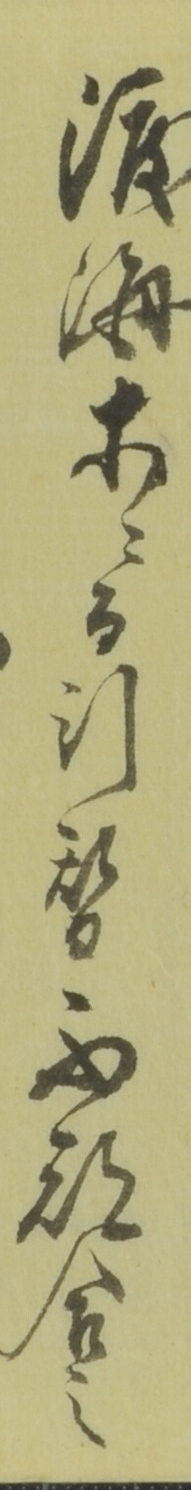渡海等ニ而引替不都合之
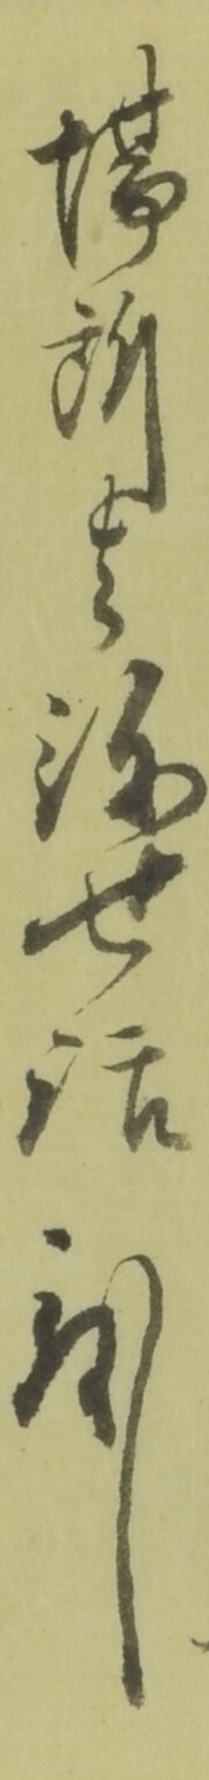場所は弥世話致し
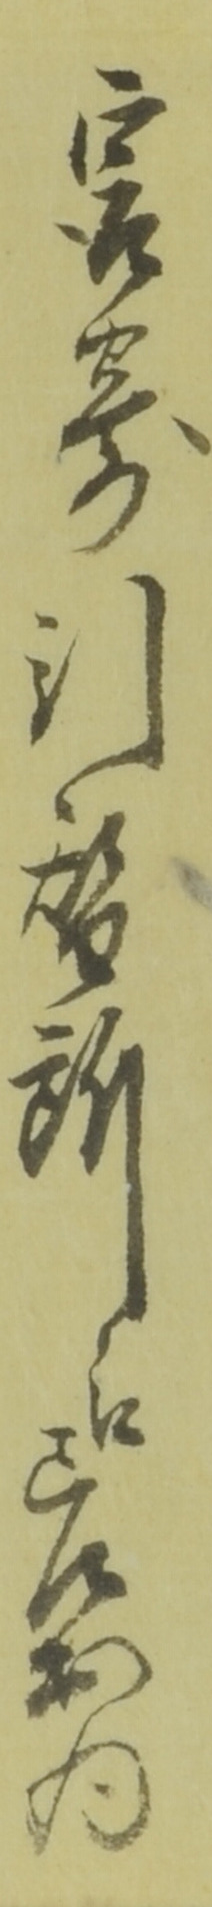最寄引替所江差出為
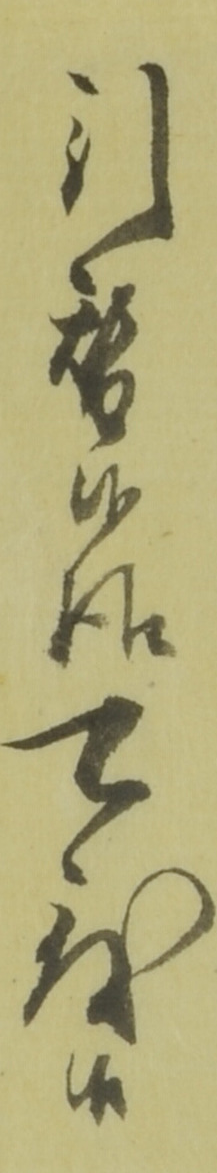引替候様可致候
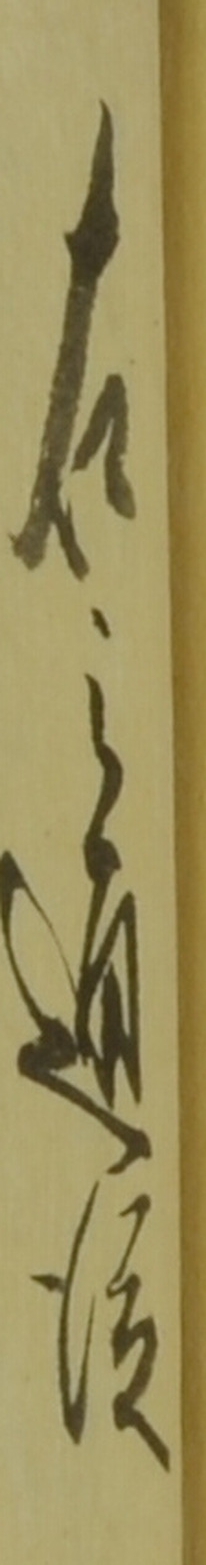右之通従
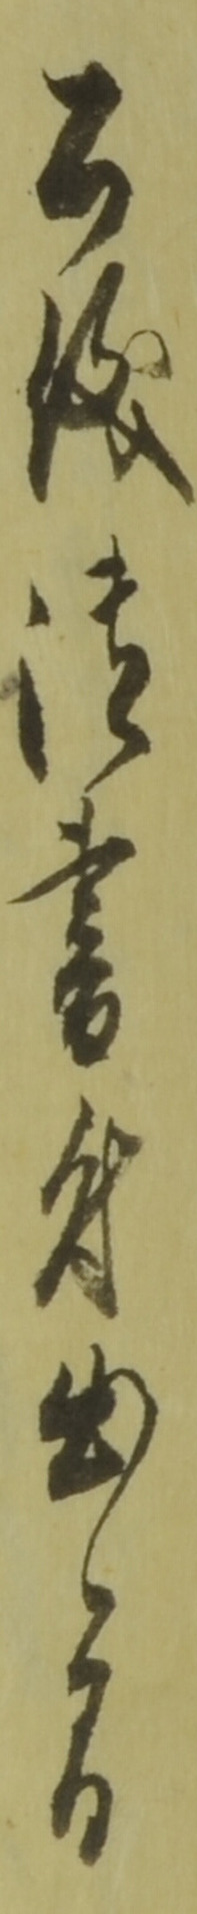公儀御書付出候間
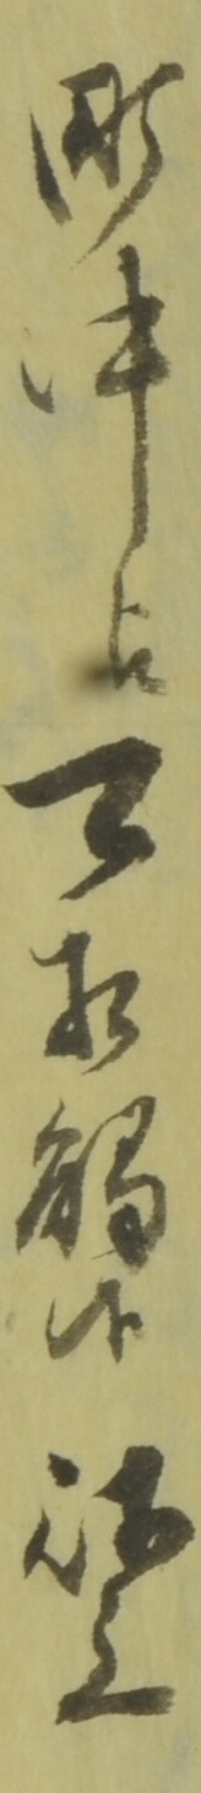町中江可相触候以上

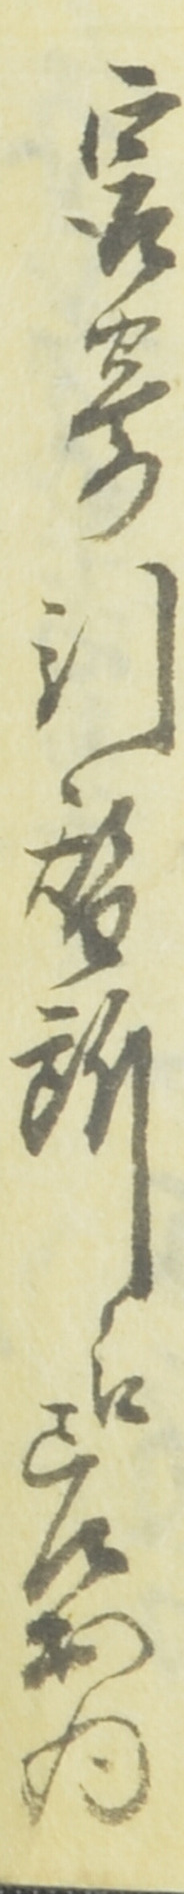最寄引替所江差出為
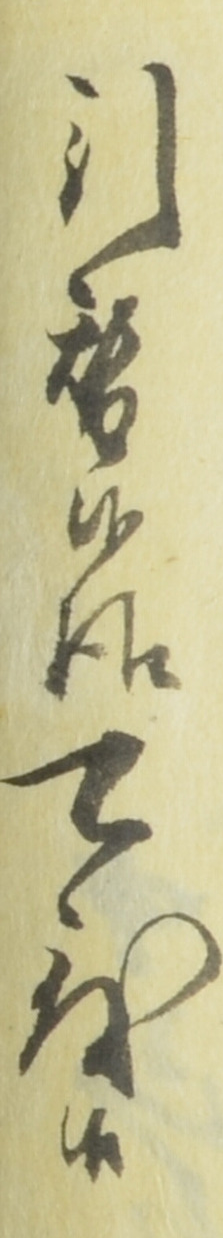引替候様可致候
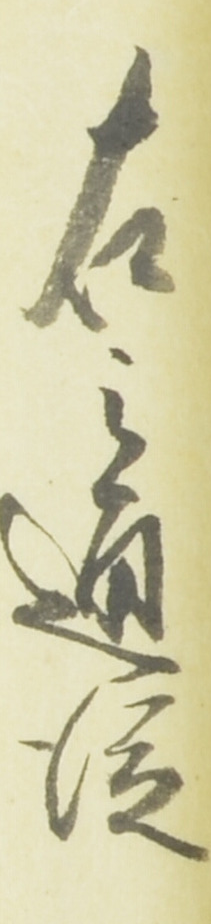右之通従
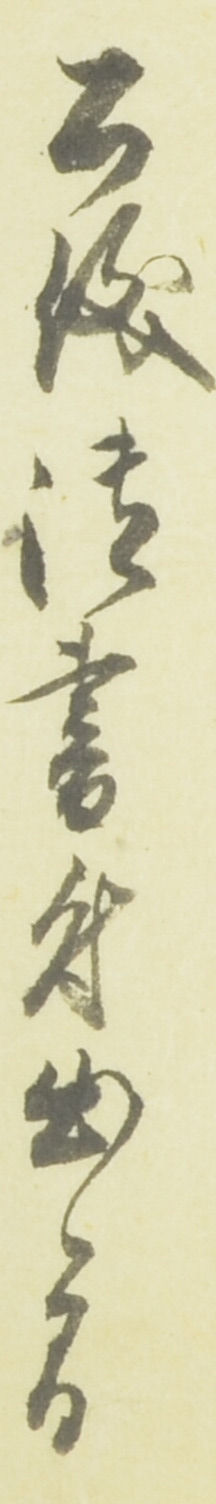公儀御書付出候間
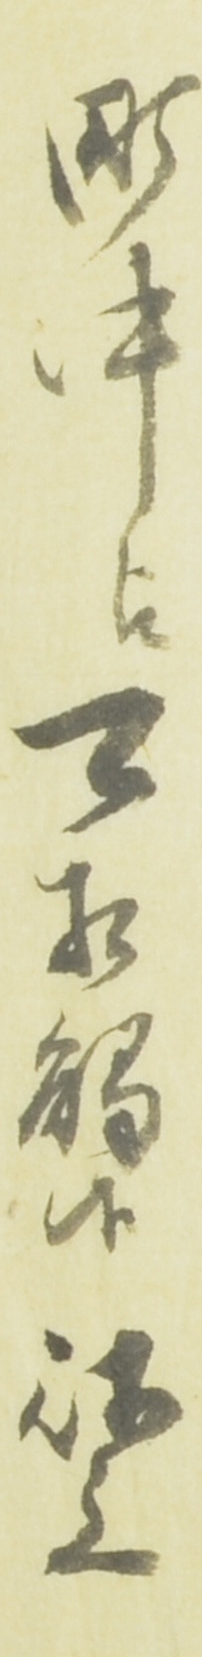町中江可相触候以上
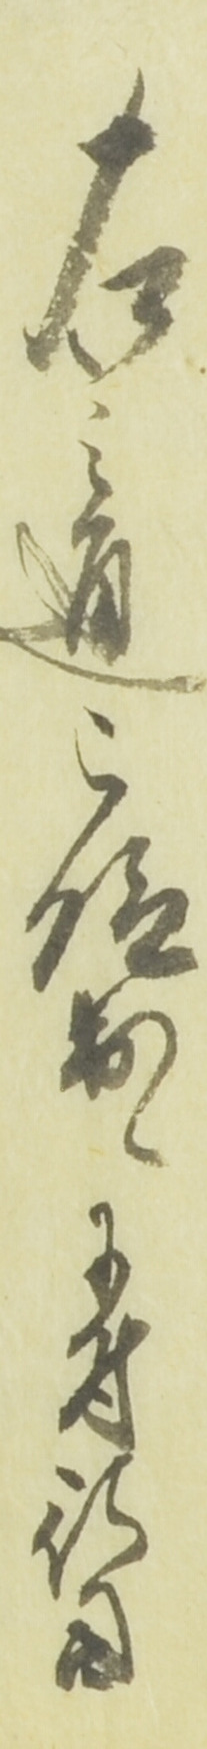右之通被仰出候に付行司
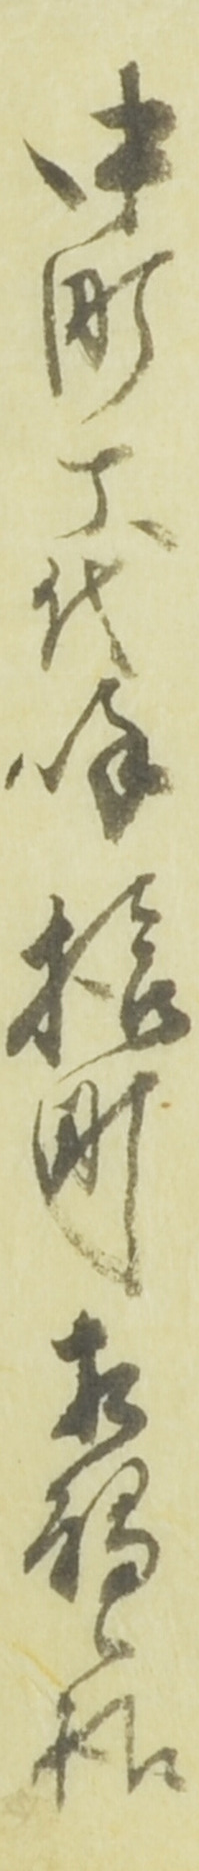中町丁代呼拾町相触候様
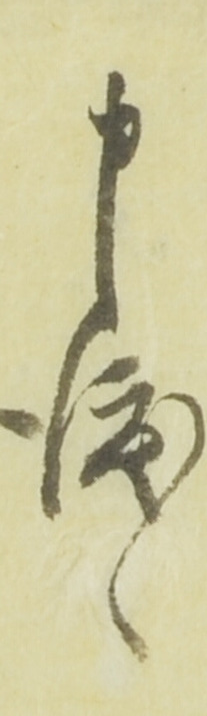申渡候
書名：御触書御書附控
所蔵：伊那市立高遠町図書館・合同会社AMANE
